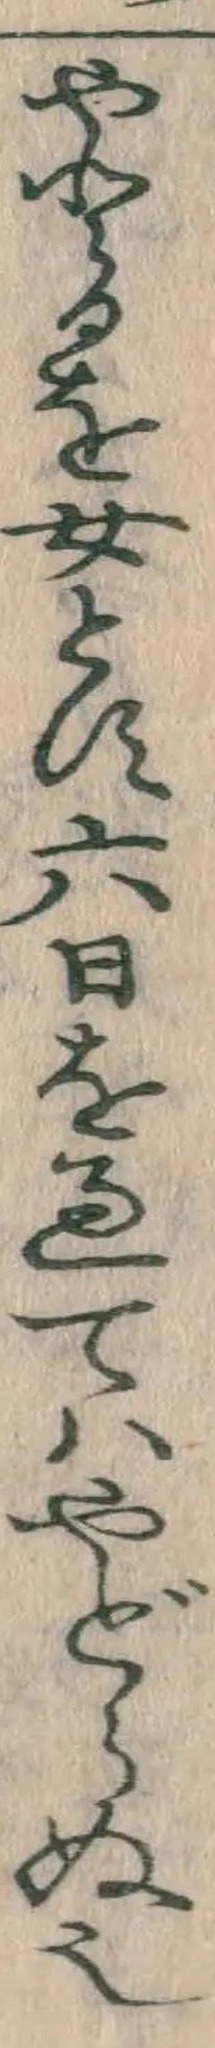やとるを女とす六日を過てはやどらぬ也
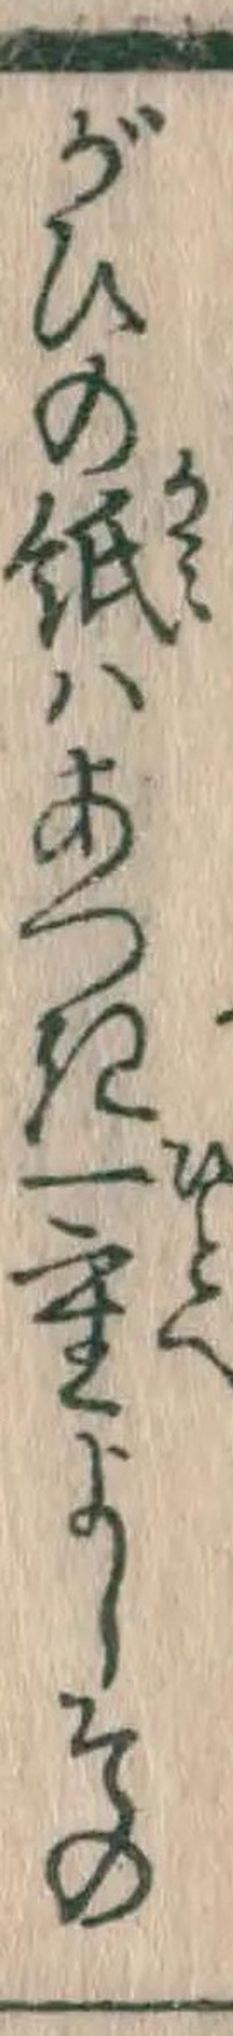がひの紙はあつき一重よしその
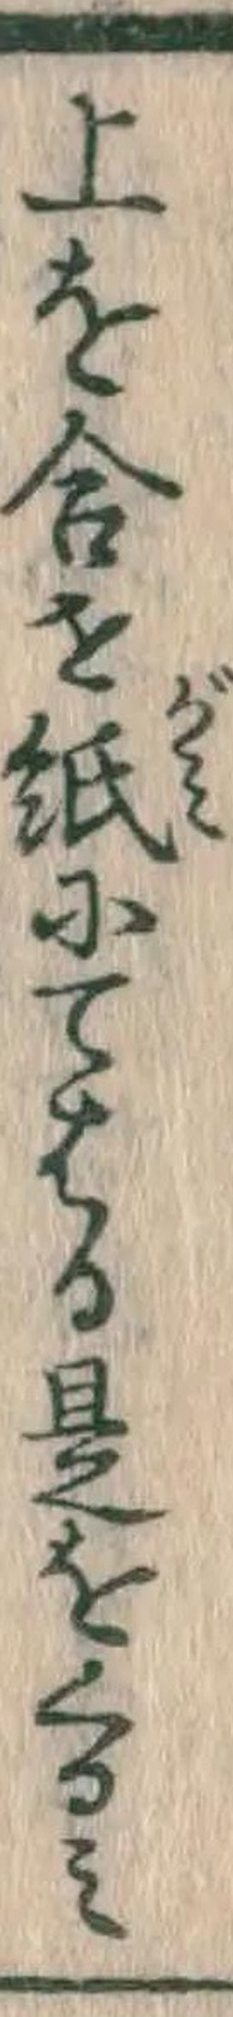上を合せ紙にてはる是をくるみ
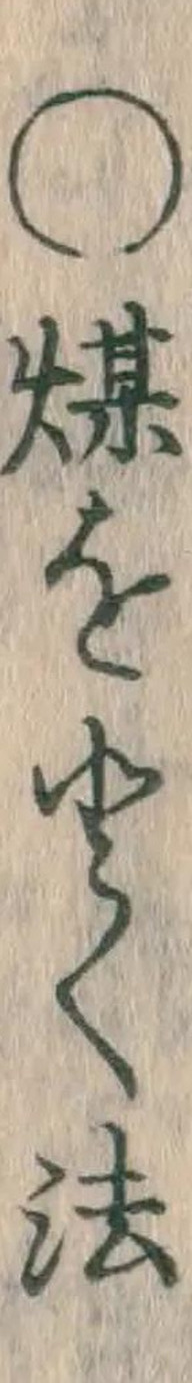○煤をとく法
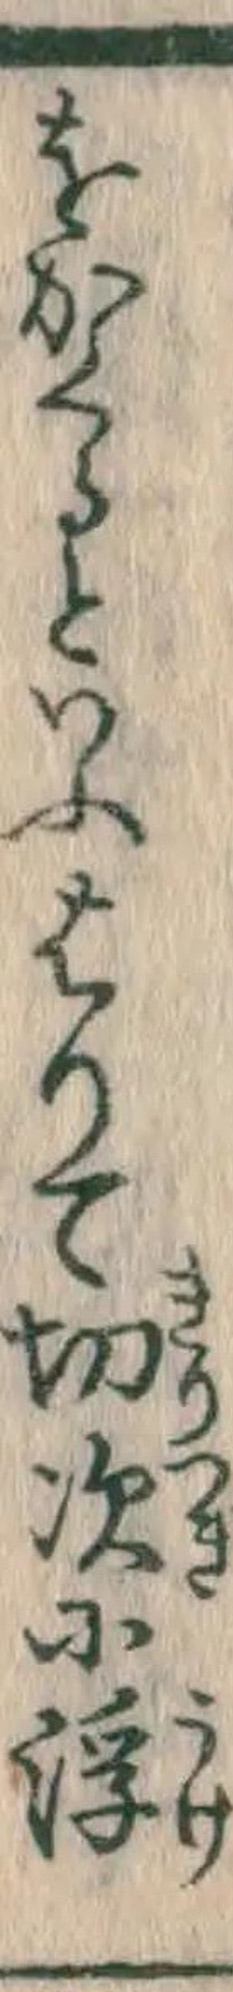をかくるといふはりて切次に浮
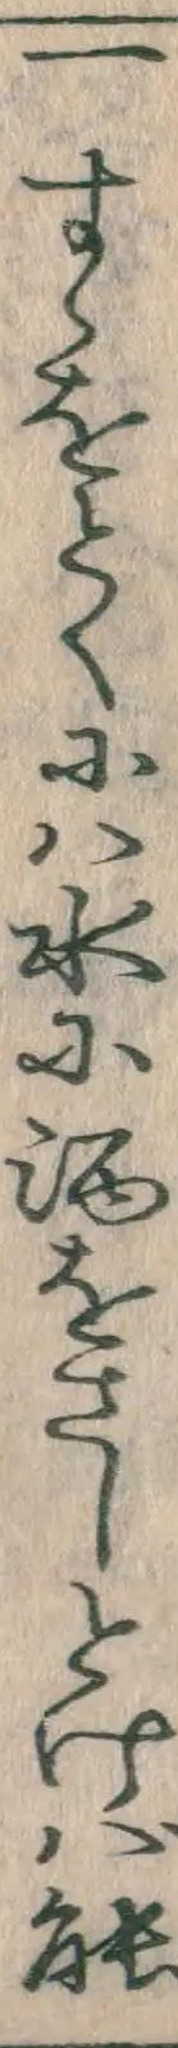一すゝをとくには水に酒をさしとけば能
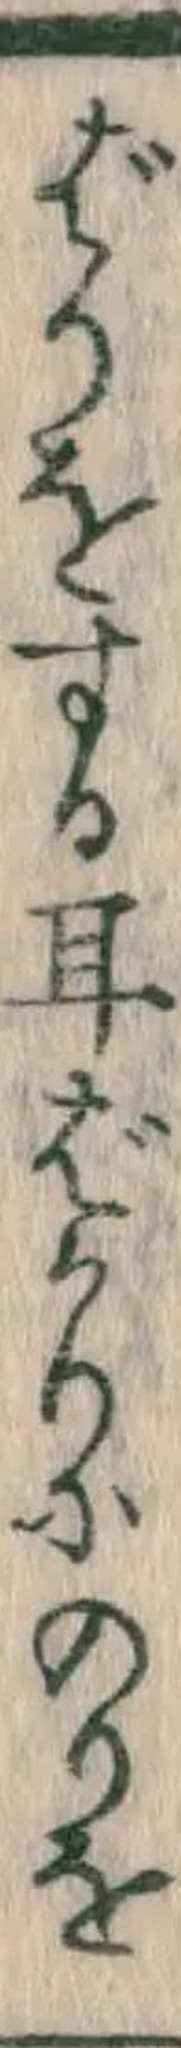ばりをする耳ばかりにのりを
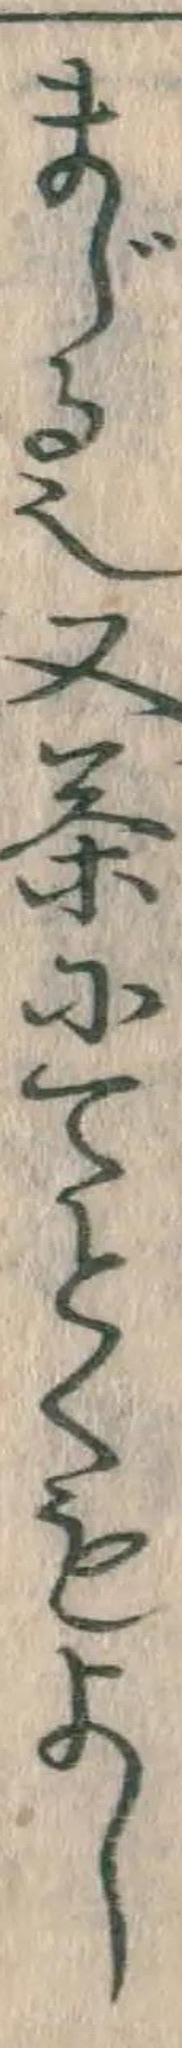まじる也又茶にてとくもよし
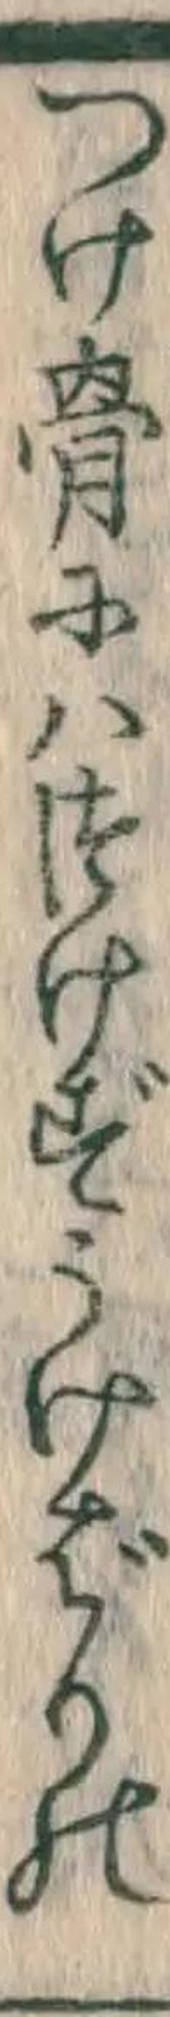つけ骨にはつけずうけばりの
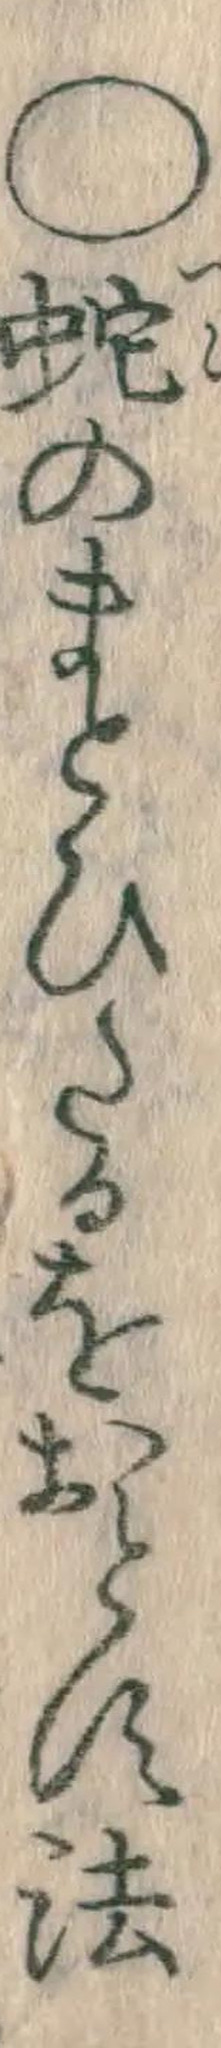○蛇のまとひたるをおとす法
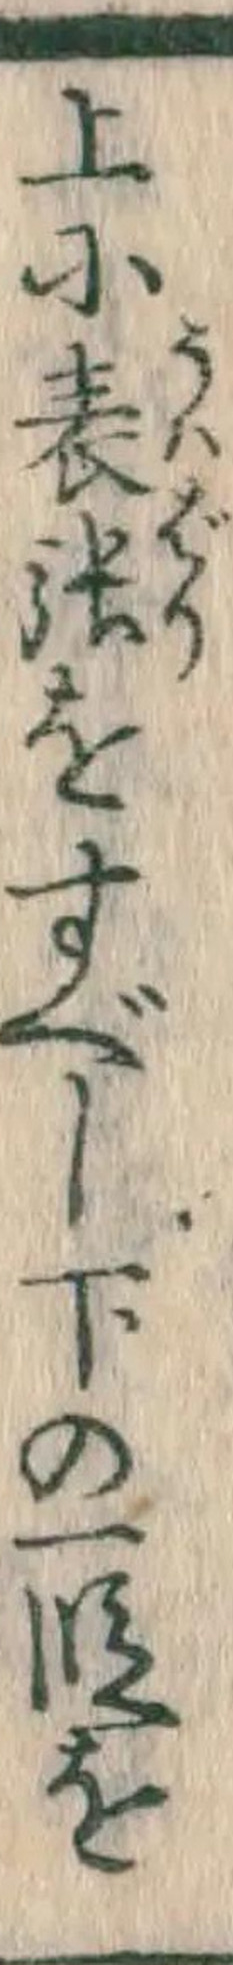上に表張をすべし下の一段を
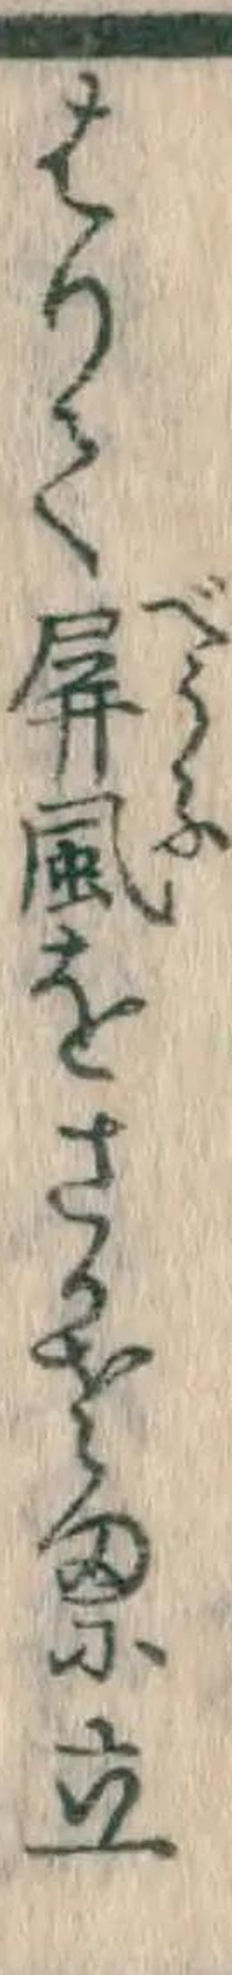はりて屏風をさかさまに立
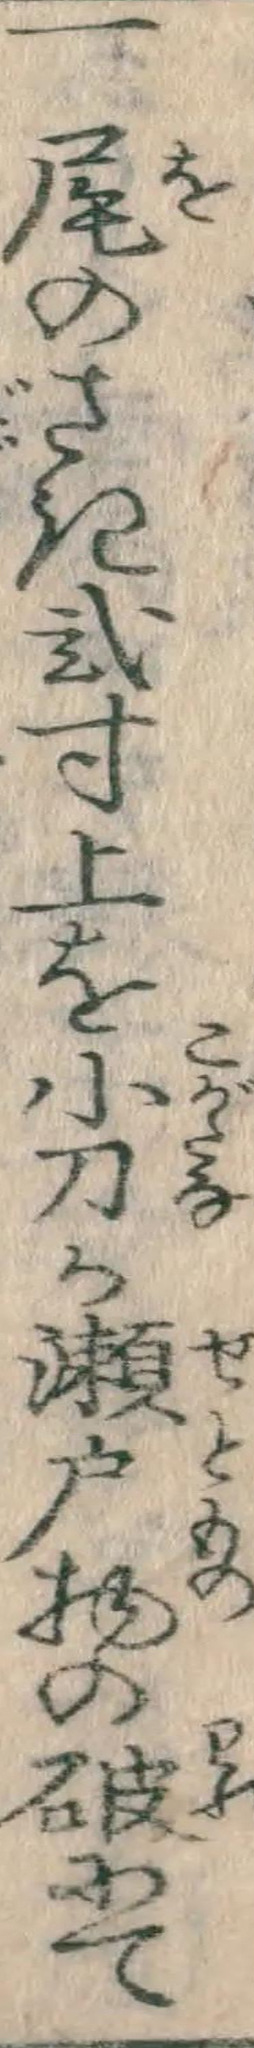一尾のさき弍寸上を小刀か瀬戸物の破にて
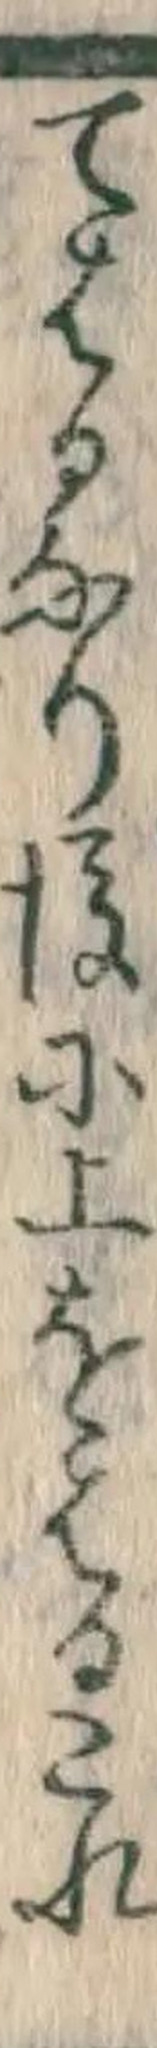てはるなり後に上をはるこれ
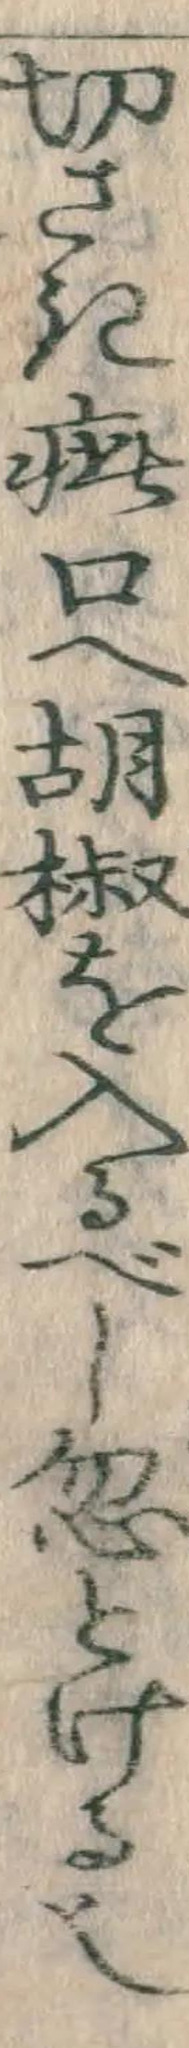切さき疵口へ胡椒を入るべし忽とける也
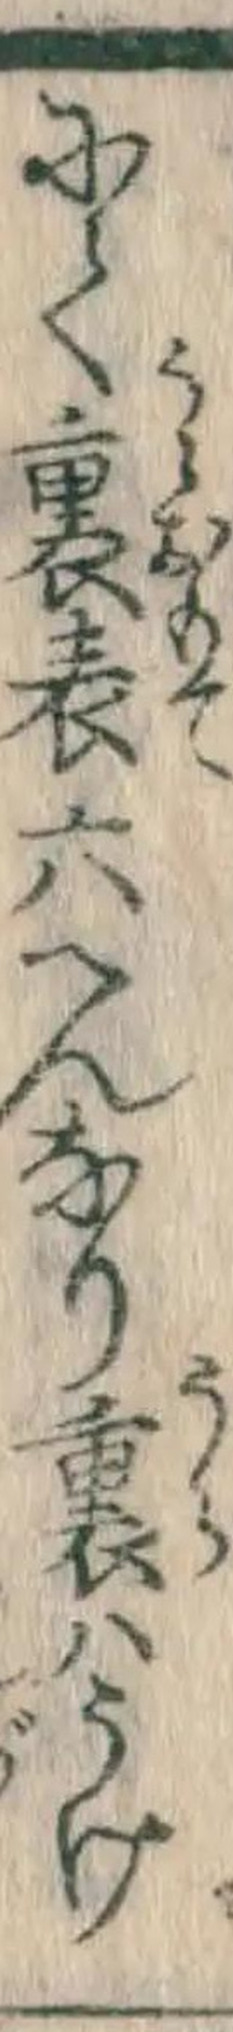にて裏表六へんなり裏はうけ
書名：広益秘事大全 3巻. [2]
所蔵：国立国会図書館 National Diet Library, JAPAN
